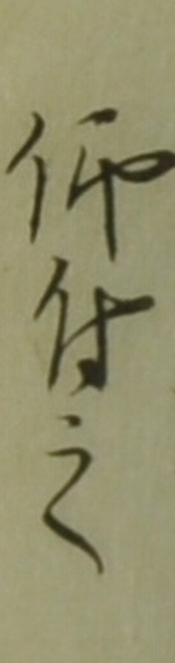仰付之
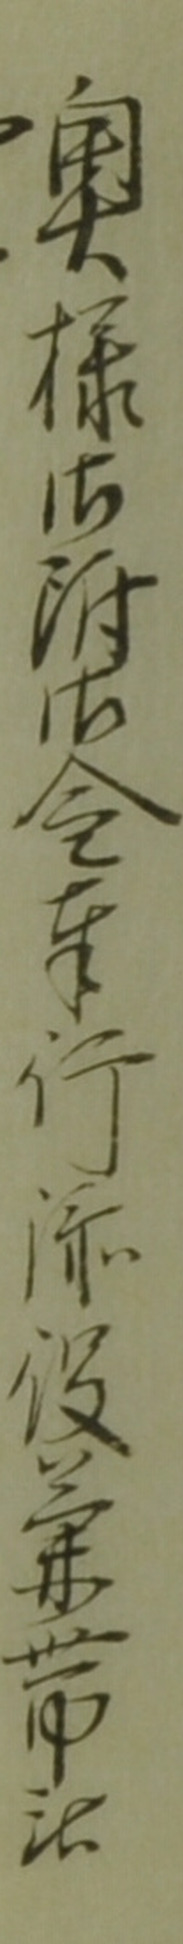奥様御附御金奉行添役兼帯被

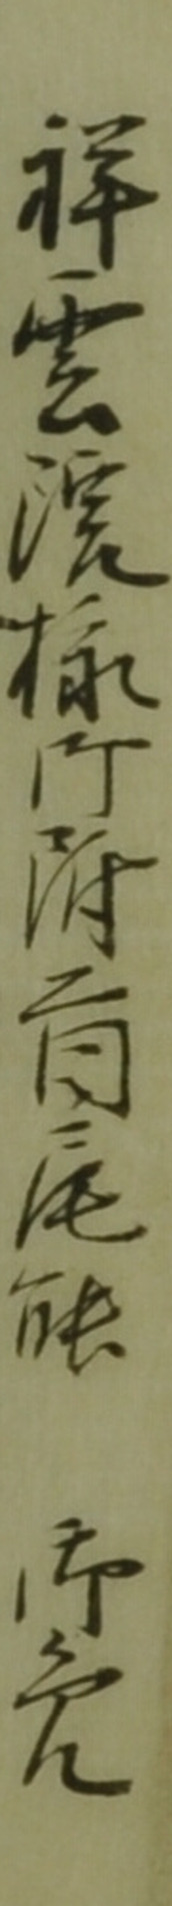祥雲院様御附首尾能御免
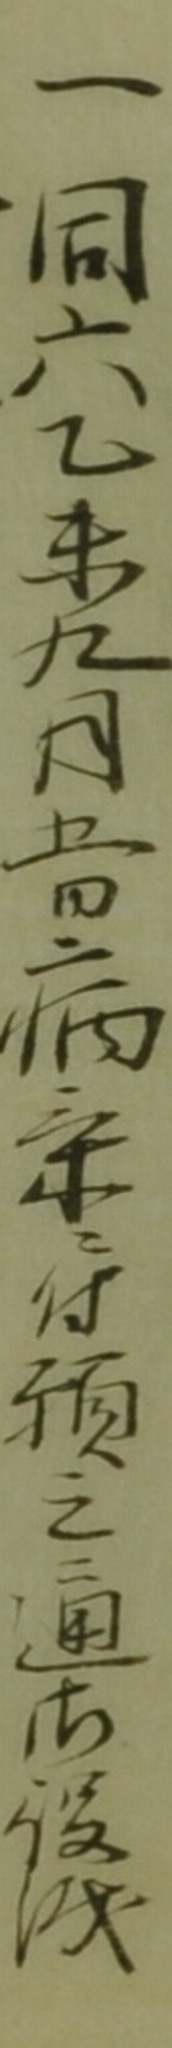一同六乙未九月五日病気付願之通御役儀
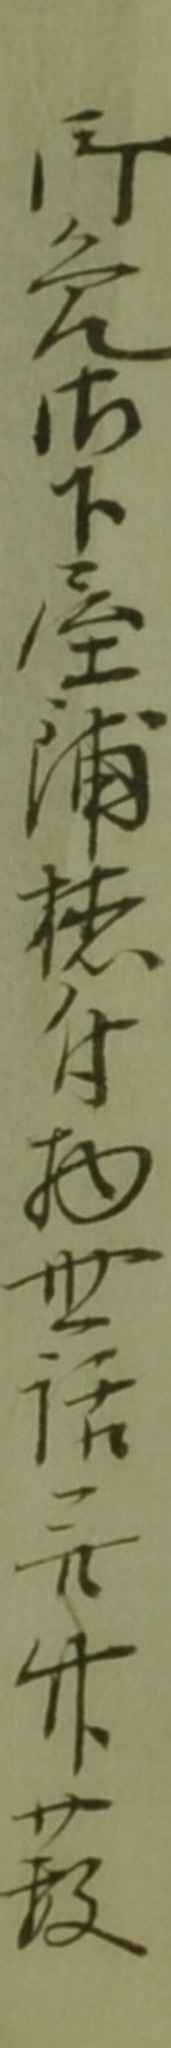御免御下屋舗植付物世話并竹藪
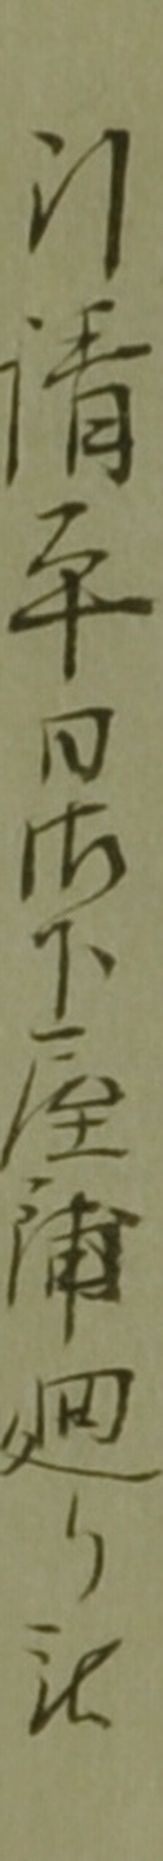引請平日御下屋舗廻り被
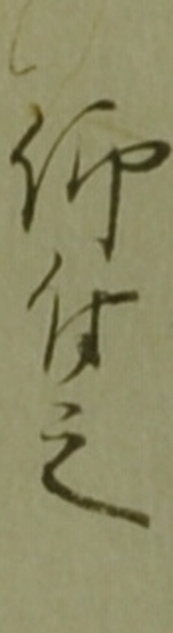仰付之
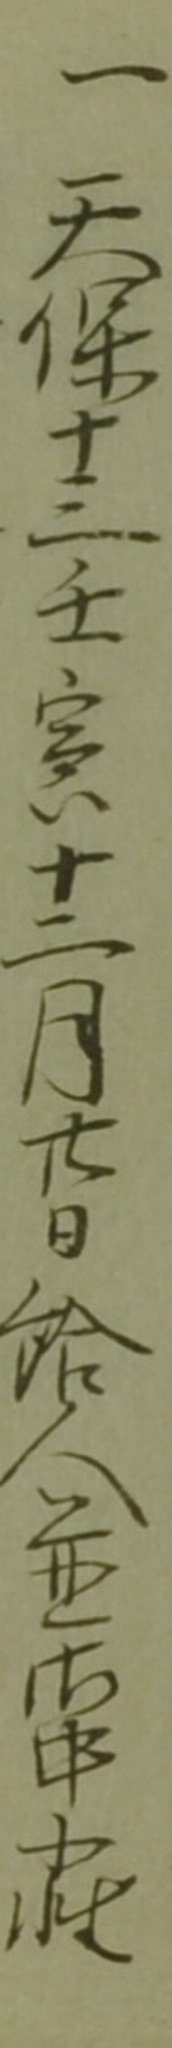一天保十三壬寅十二月廿日給人並御中小性
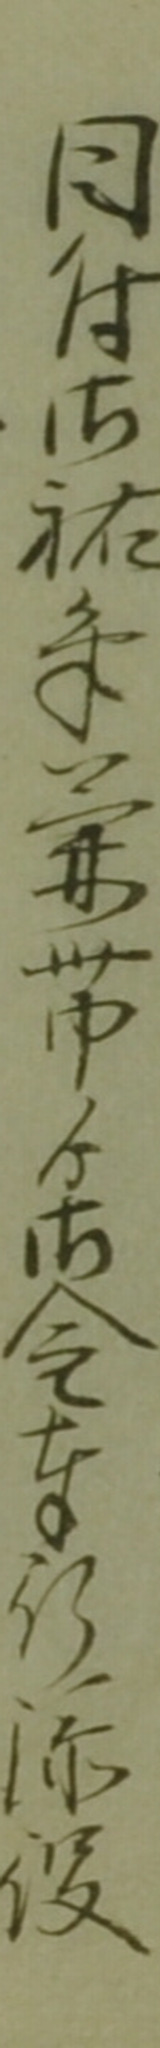目付御祐筆兼帯ゟ御金奉行添役
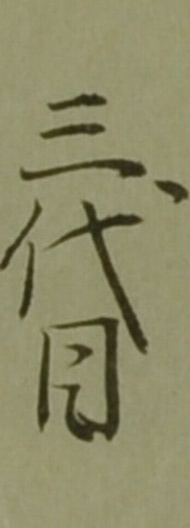三代目
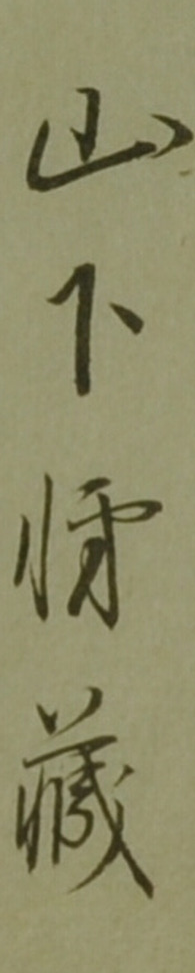山下悌蔵
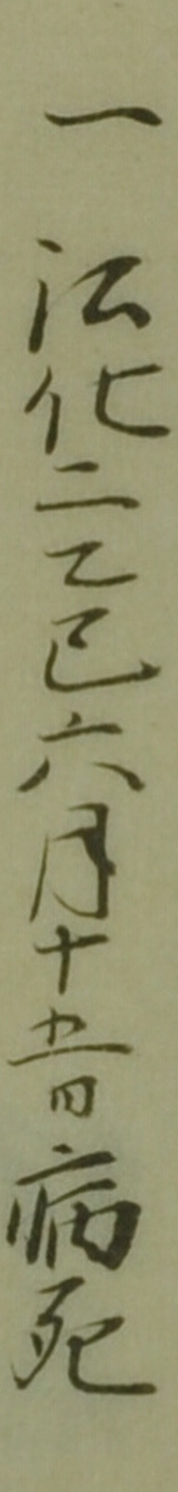一弘化二乙巳六月十五日病死
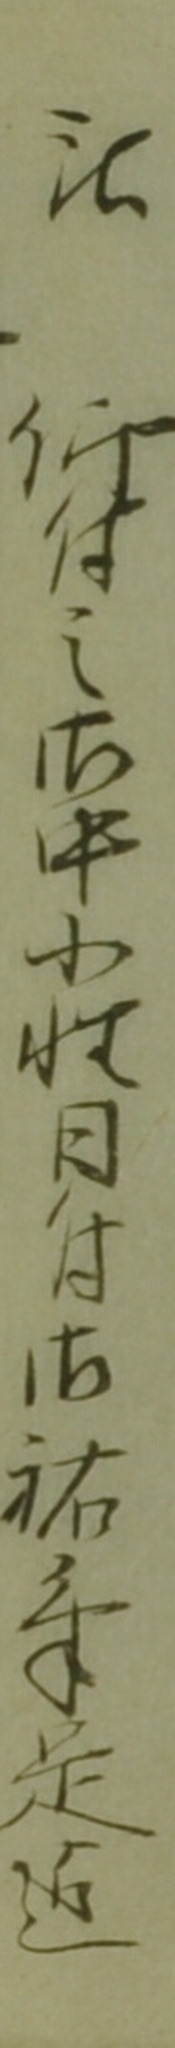被仰付之御中小性目付御祐筆是迄
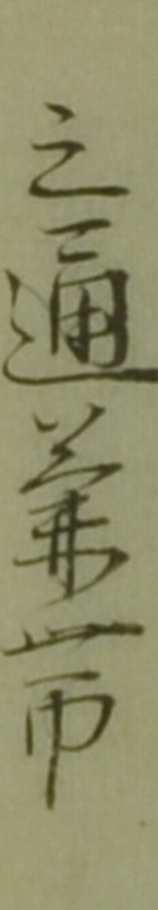之通兼帯

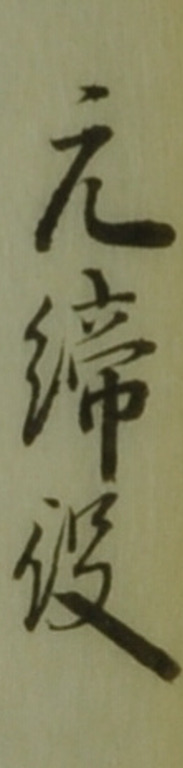元締役
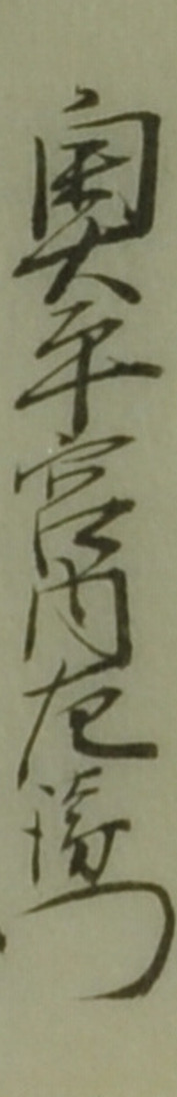奥平宮内左衛門
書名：諸御役代々録（七）
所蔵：伊那市立高遠町図書館・合同会社AMANE
